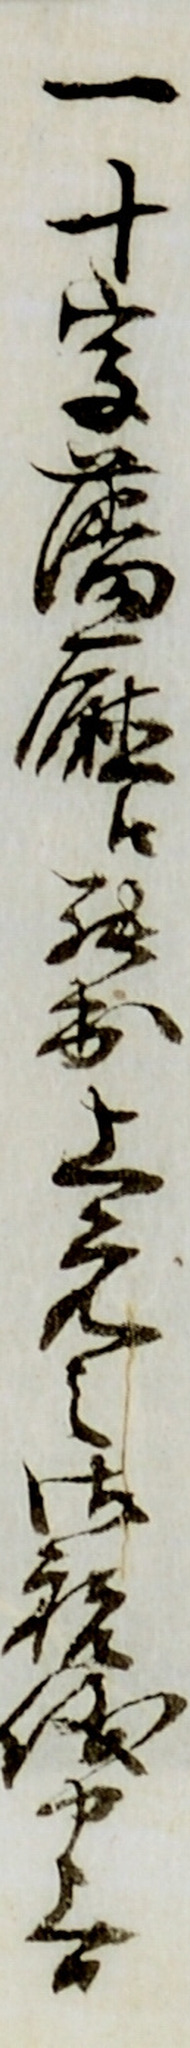一十字藩庁え罷出上元之御祝儀申上候
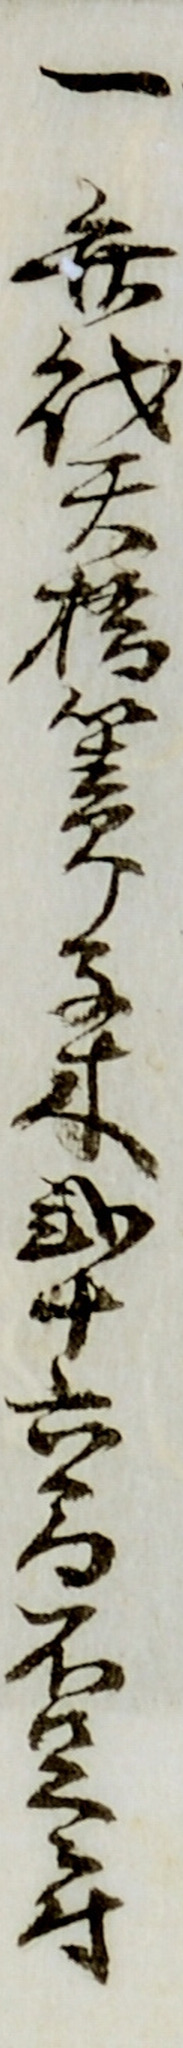一弁財天橋簀ノ子木弐十六間不足に付
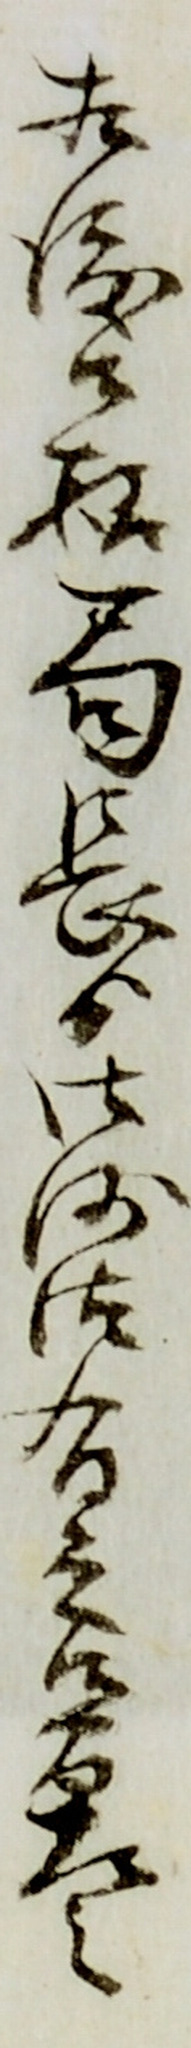相渡候様局長ゟ御沙汰有之候間左之
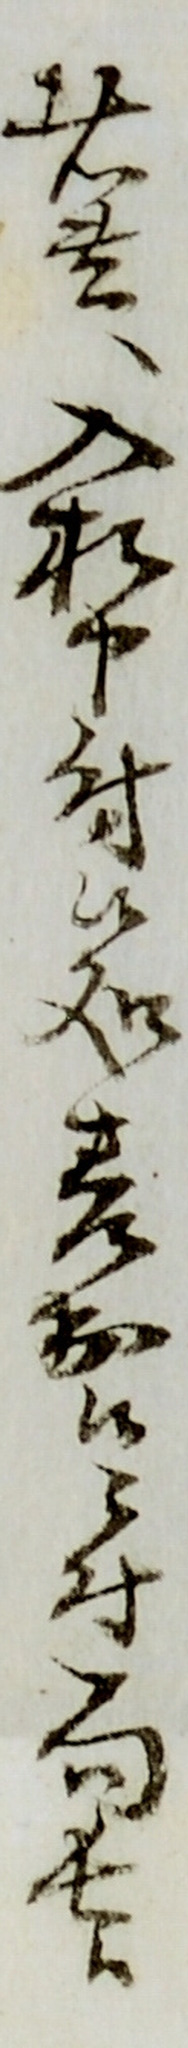者共へ入札申付候処差出候に付局長え
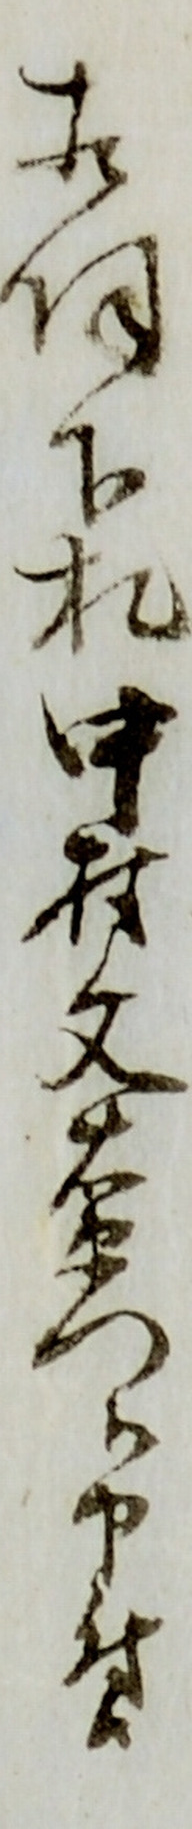相伺下札中村文右衛門え申付候
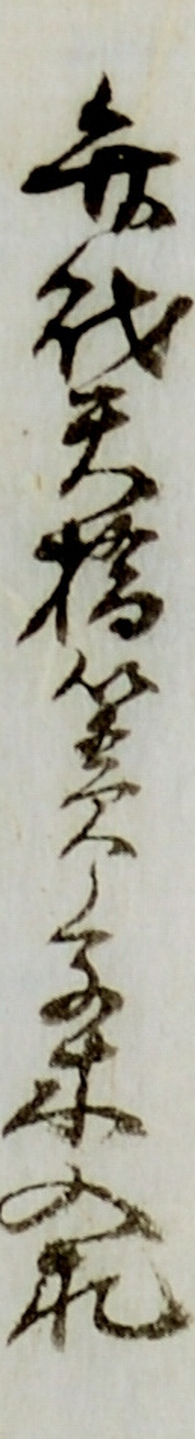弁財天橋簀ノ子木入札
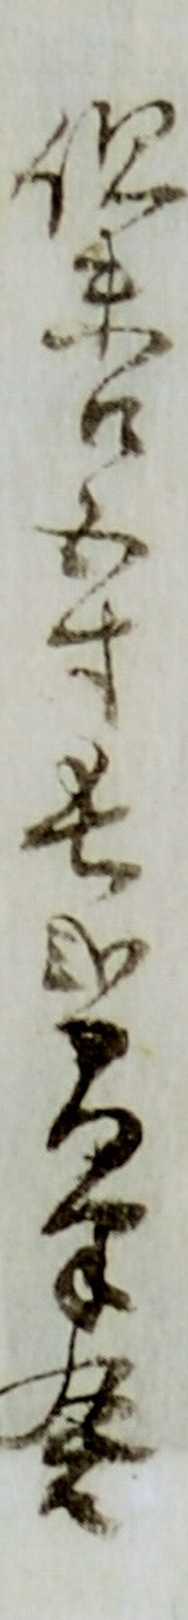但末口五寸長弐間半丸太

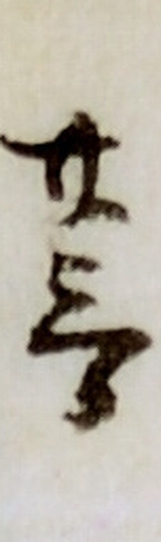廿三日
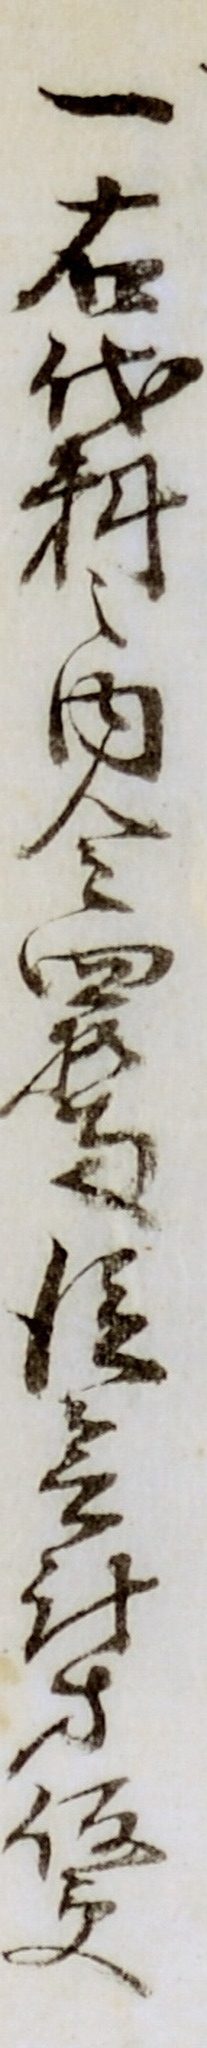一右代料之内金四拾両従会計方仮受
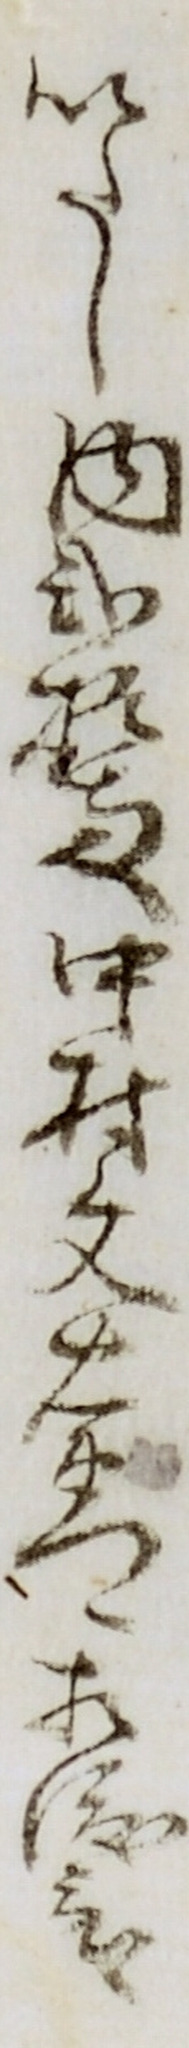いたし内弐拾両中村文右衛門へ相渡置候
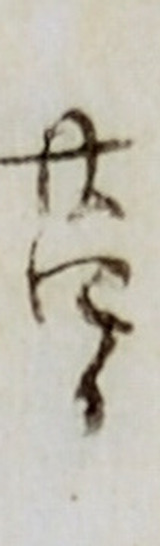廿四日
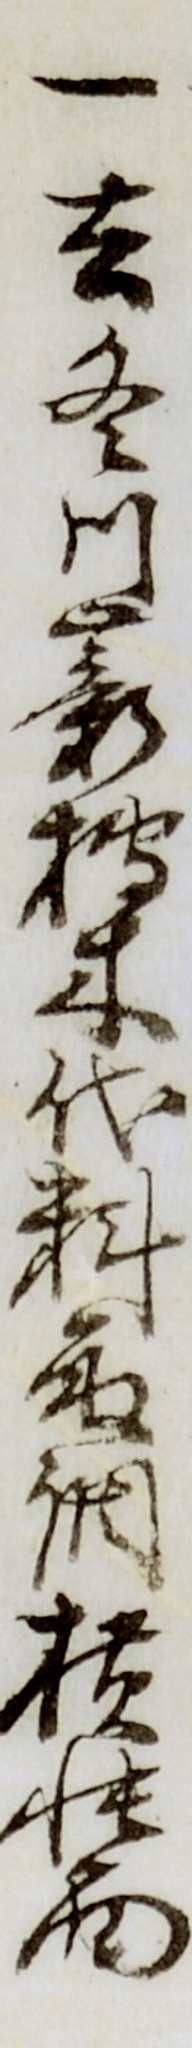一去冬川薪榑木代料取調横帳面
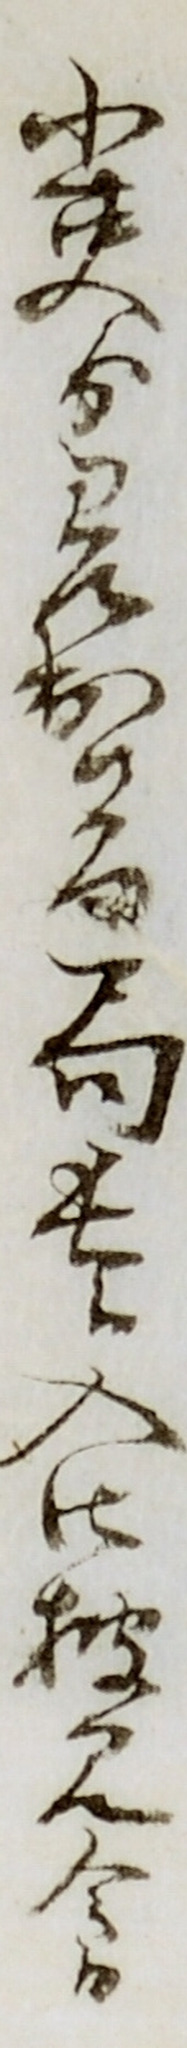小吏ゟ差出候間局長え入御披見今日
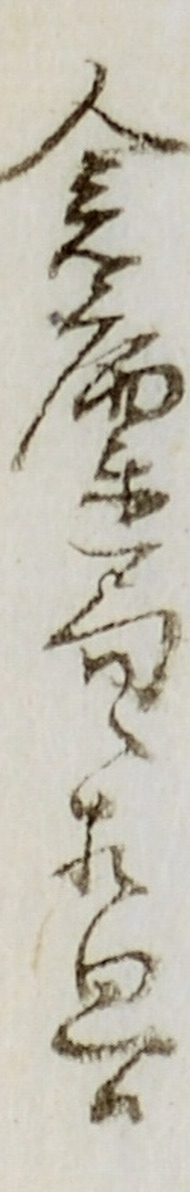倉廩局へ相廻候
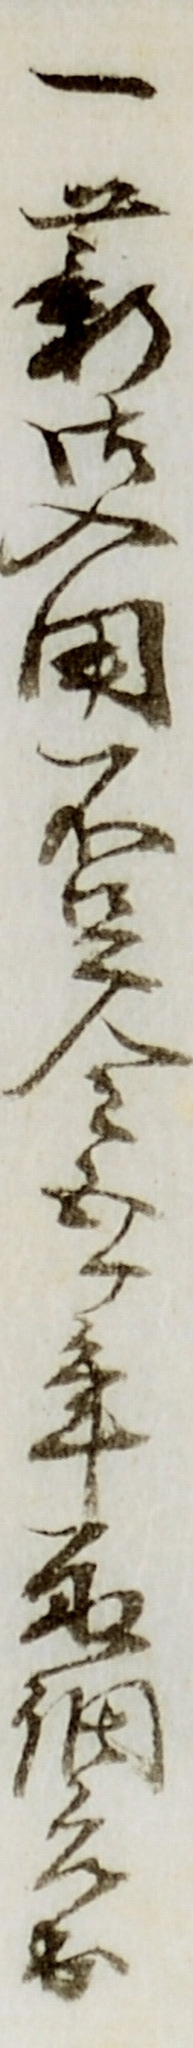一薪御入用不足金五ヶ年取調差出
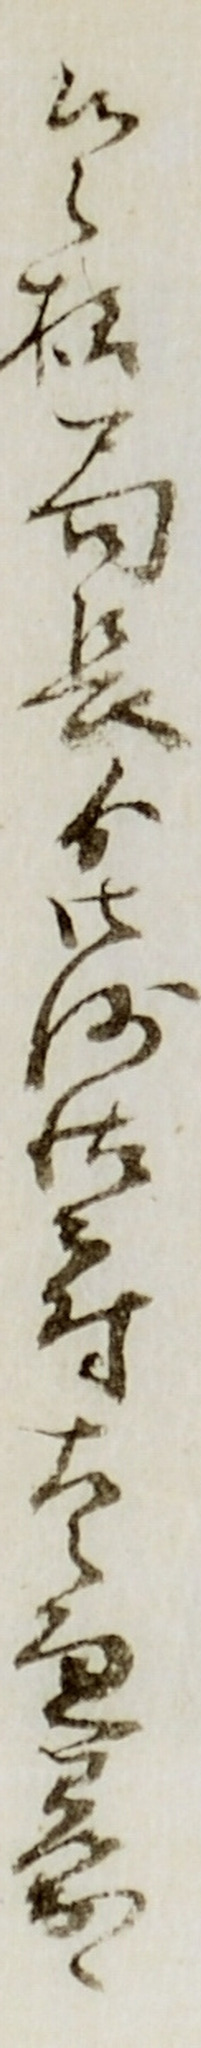候之様局長ゟ御沙汰に付左之通差出候
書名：山林方諸事御用留
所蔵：伊那市立高遠町図書館・合同会社AMANE
